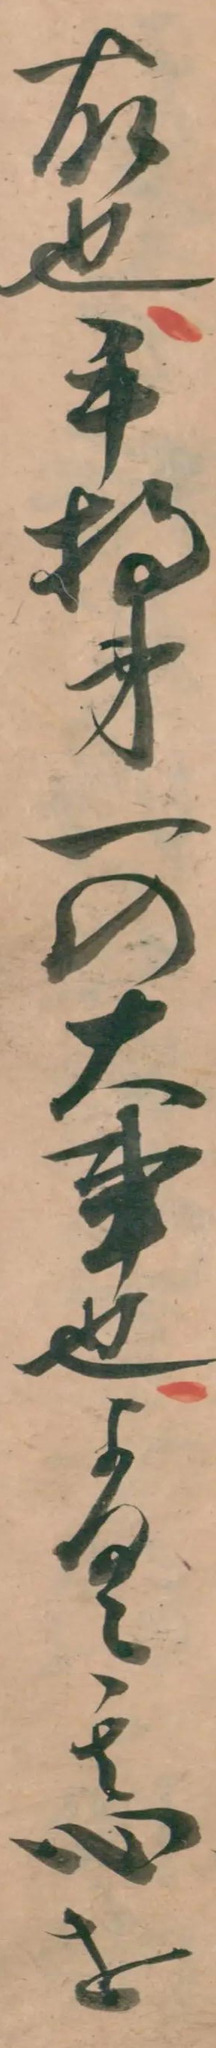故也手持第一の大事也よく其心を

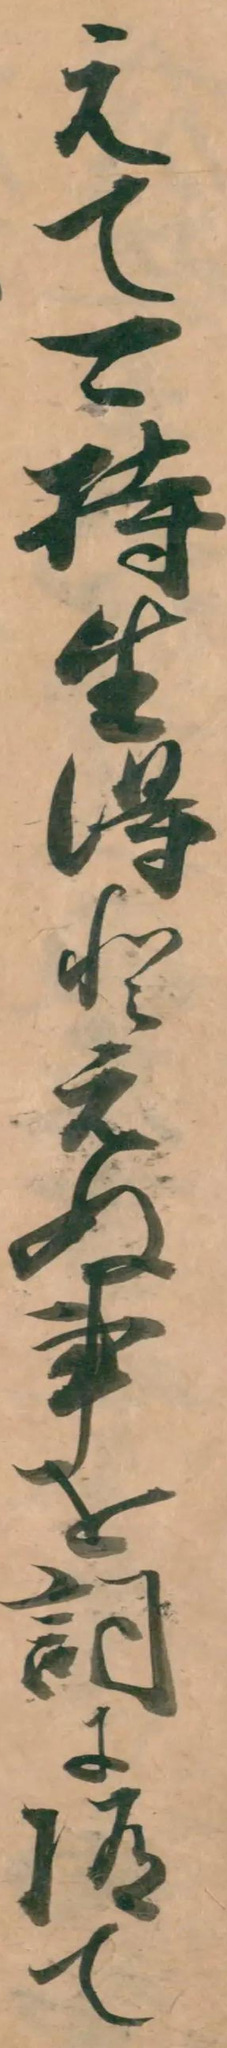えて可持生得とえぬ事を詞に随て
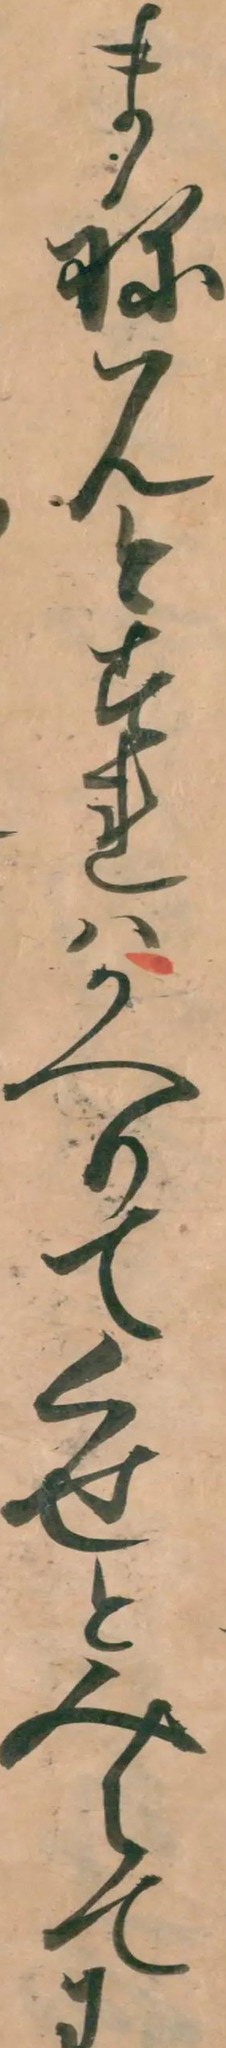まねハんとすれハかへりてくせとみしてわ
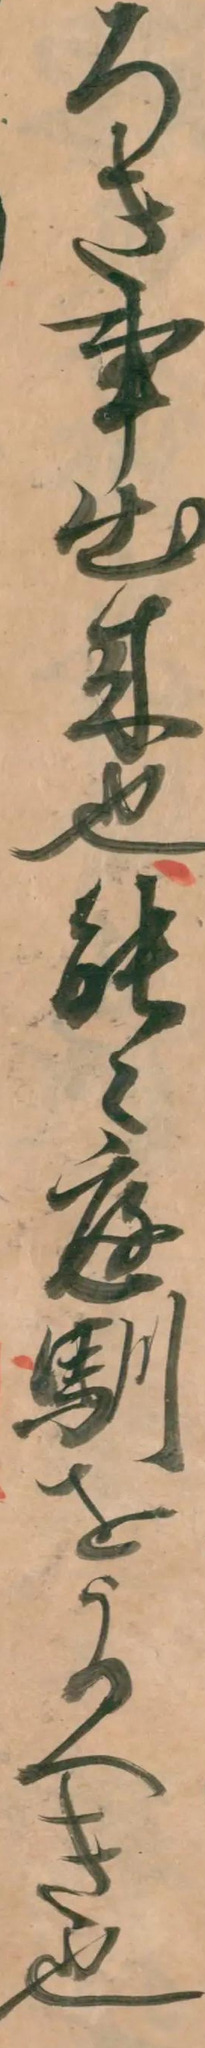ろき事出来也能々庭馴をうるへき也
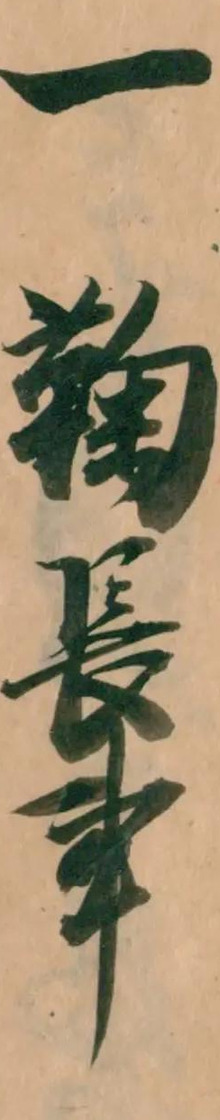一鞠長事
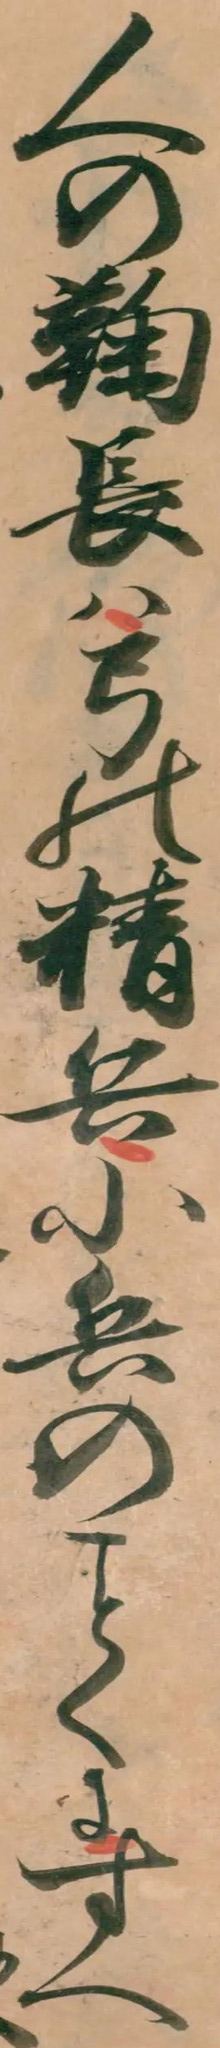人の鞠長ハ弓の精兵小兵のことくにすへて
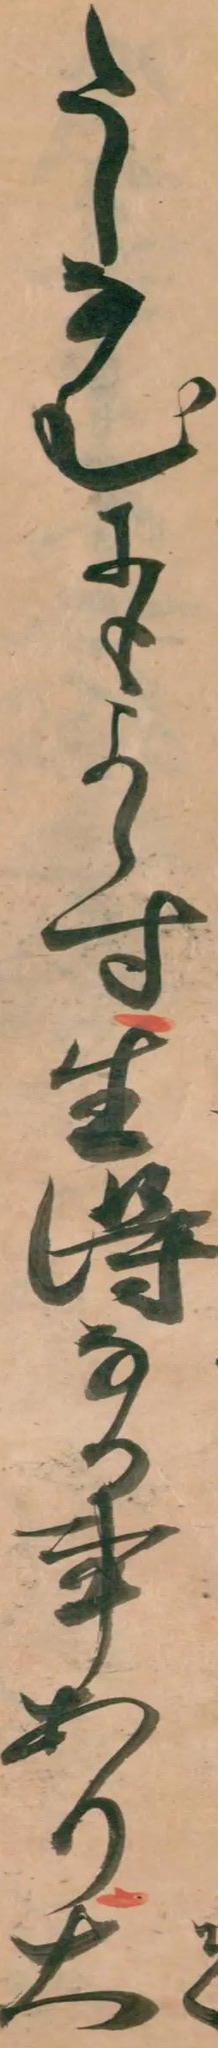たしなむにもよらす生得なる事あり大
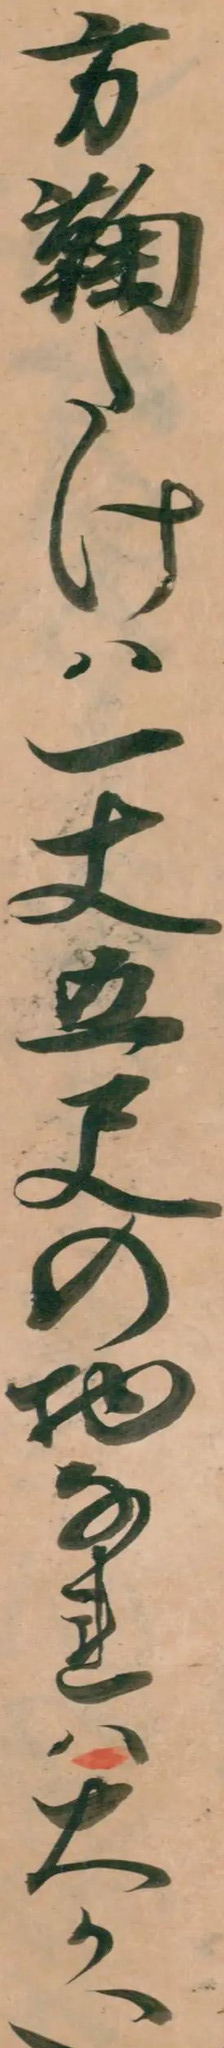方鞠たけハ一丈五尺の物なれハ大かい
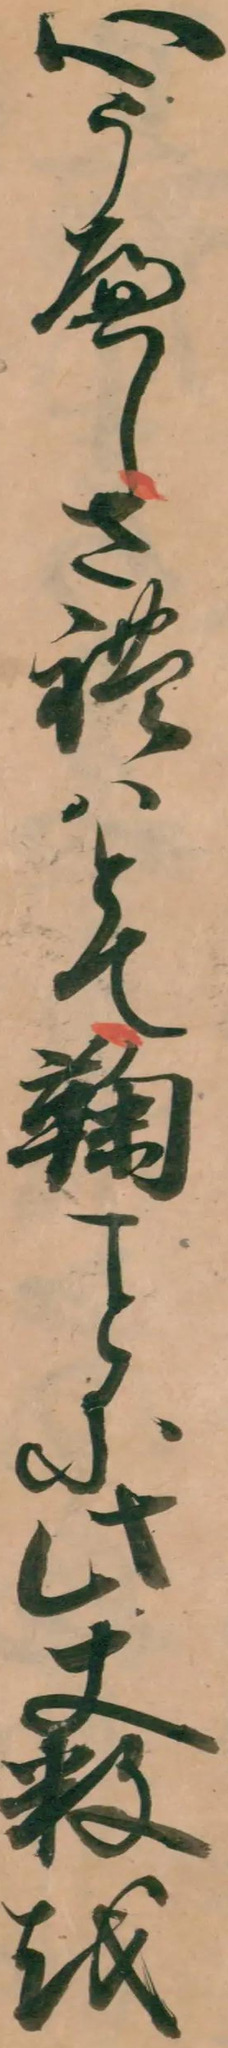心うへしされハとて鞠ことに此丈数を
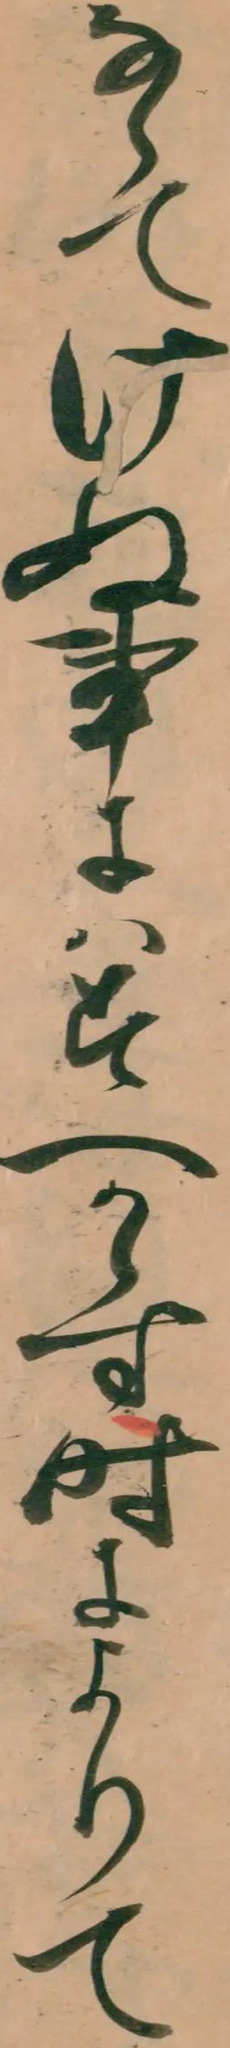ならてけぬ事にハすへからす時によりて
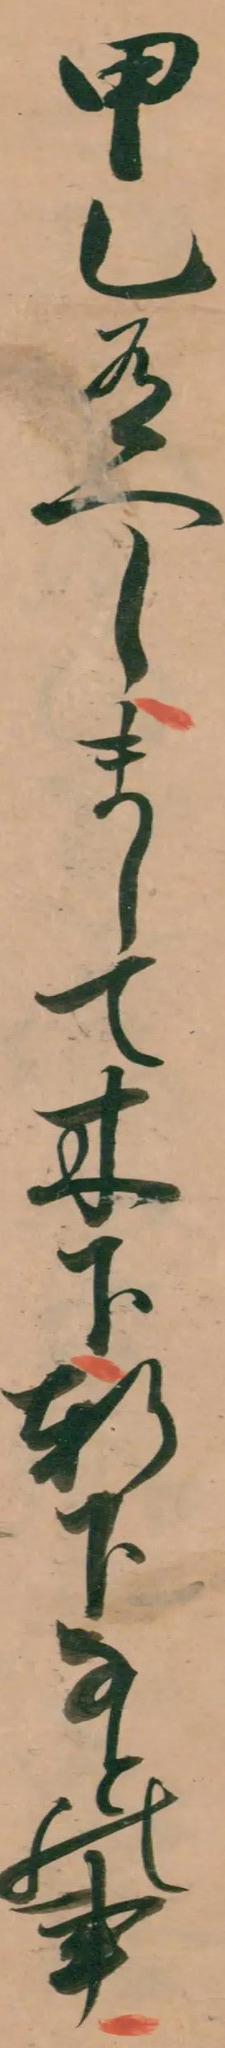甲乙有へしまして木下軒下なとの事
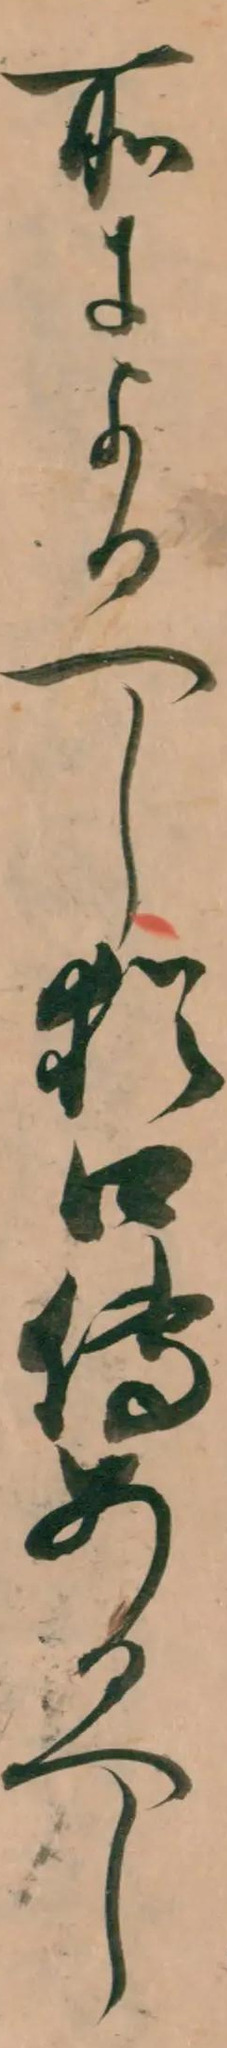所によるへし猶口伝あるへし
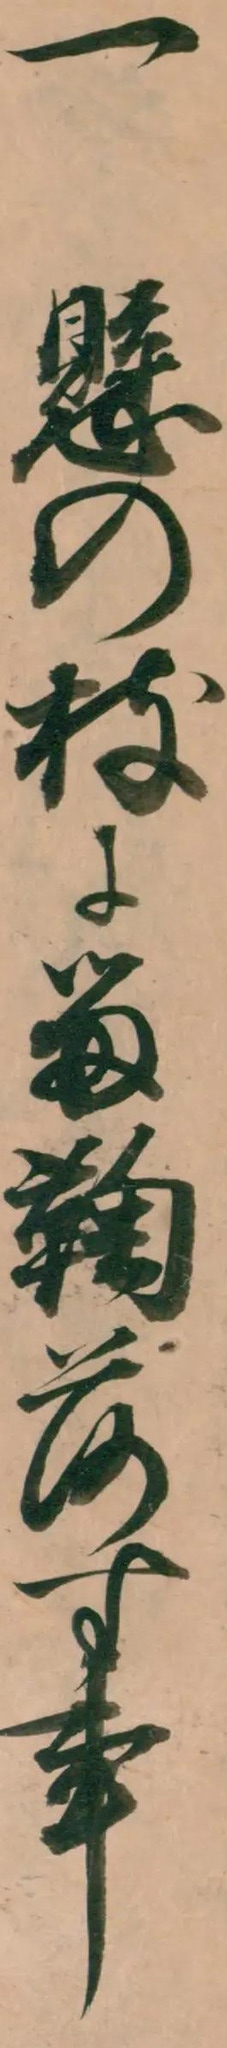一懸の枝に当鞠落す事
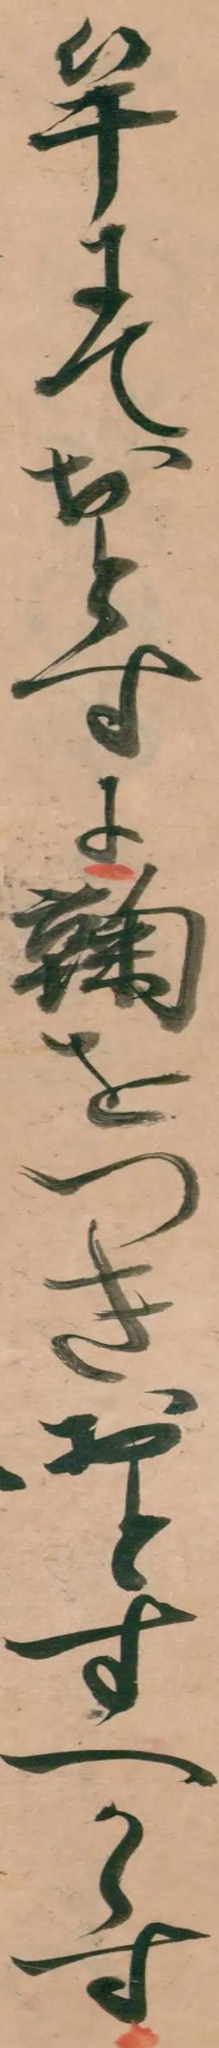竿にておとすに鞠をつきおとすへからす
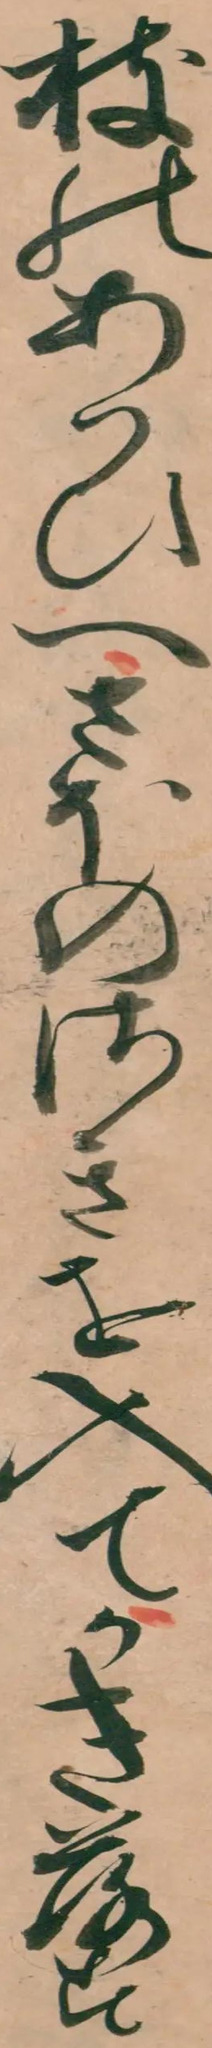枝のあハひへさほのさきを入てかき落す
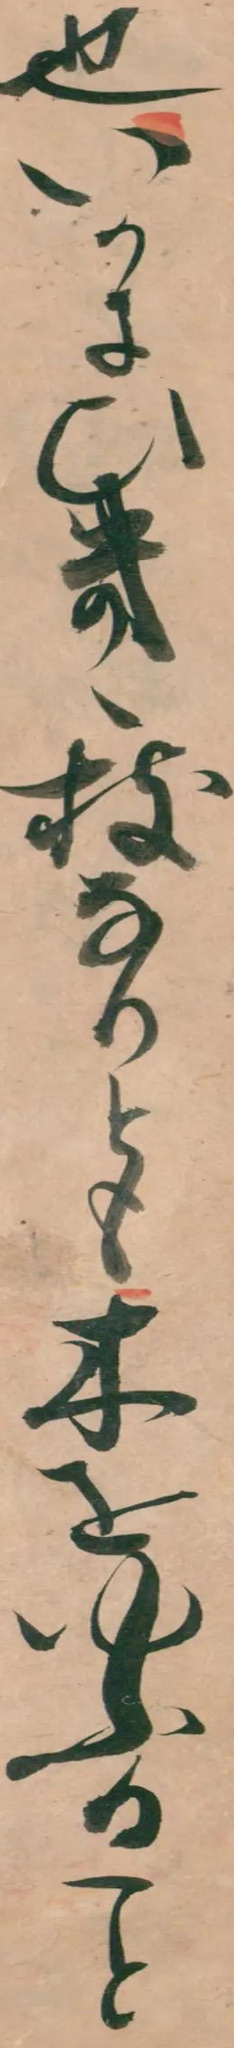也いかにひきゝ枝なりとも木をゆふること
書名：蹴鞠之条々大概
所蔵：国立国会図書館 National Diet Library, JAPAN
